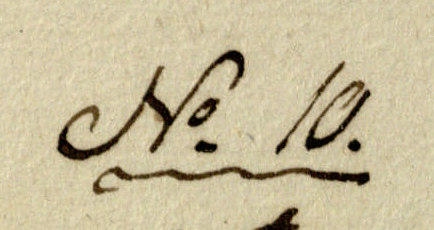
No 10.
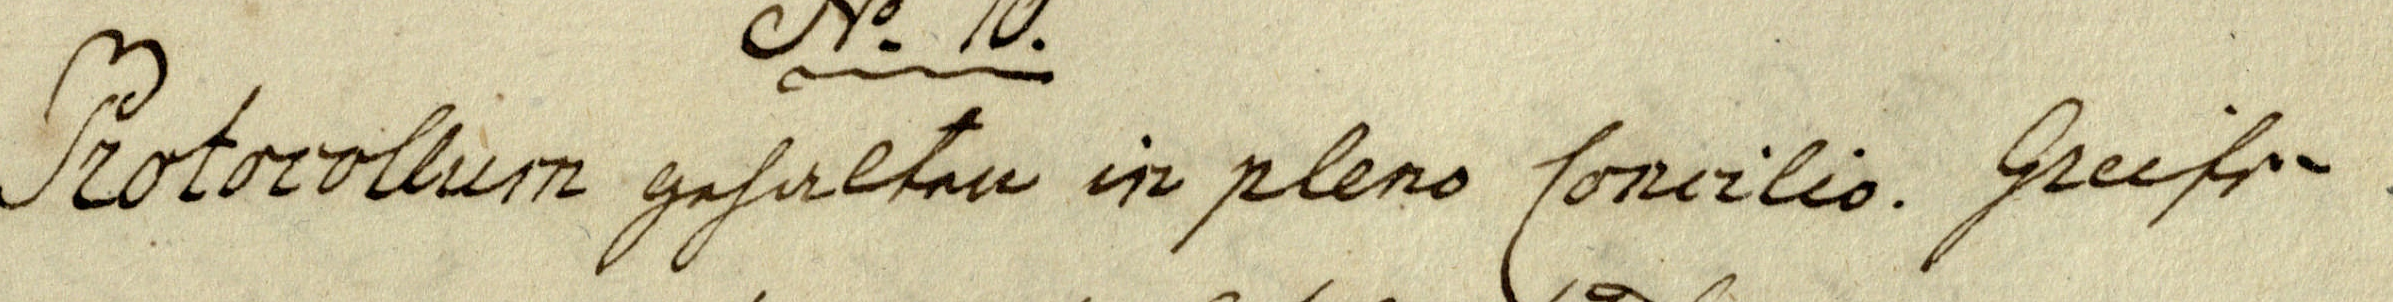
Protocollum gehalten in pleno Concilio. Greifs¬
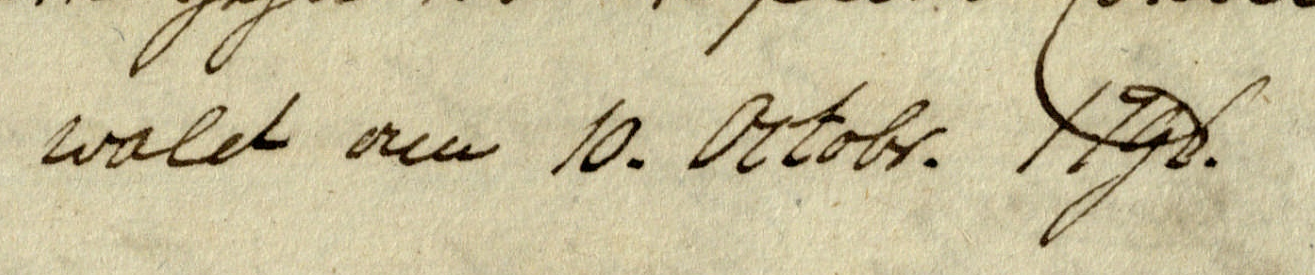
wald am 10. Octobr. 1796.
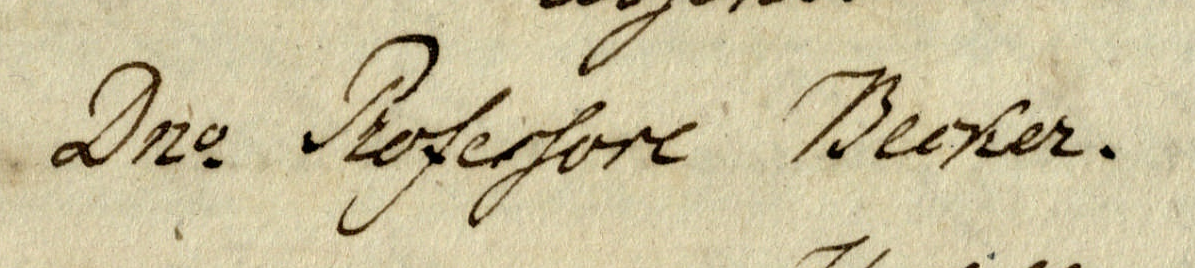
Dn Professore Becker.
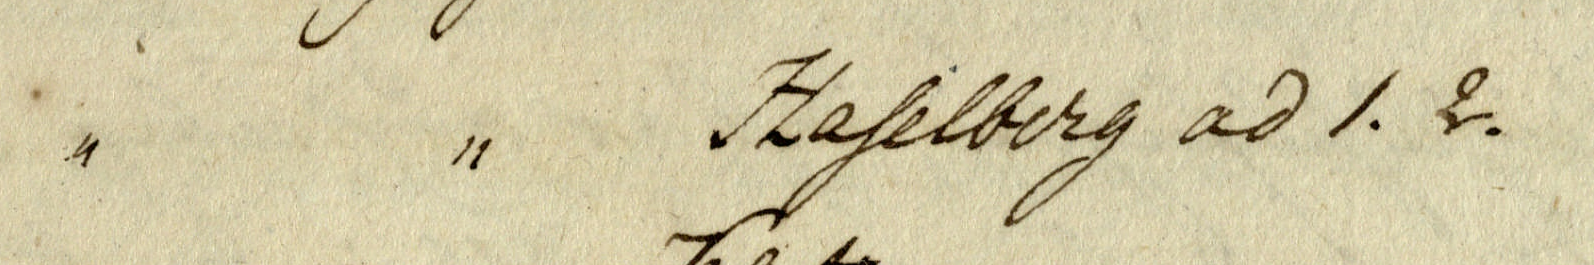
Haselberg ad 1. 2.
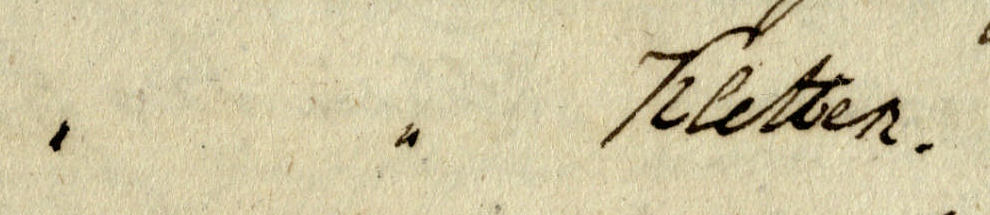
Kletten.
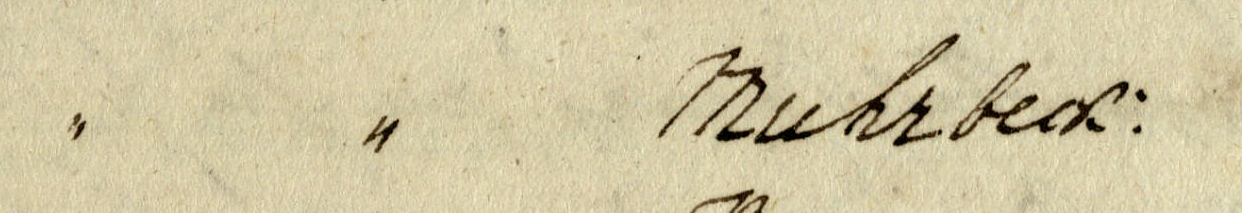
Muhrbeck.
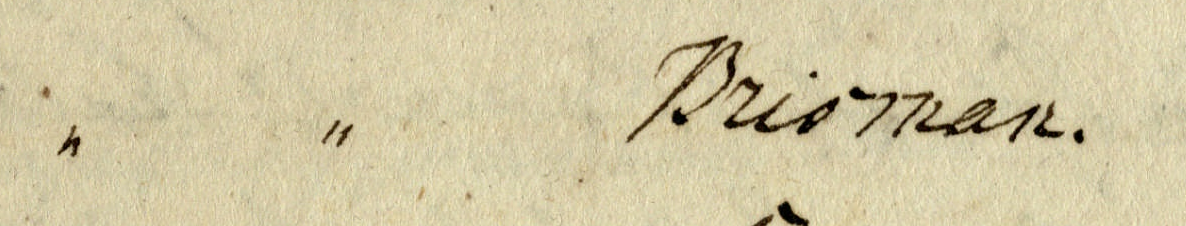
Brisman.
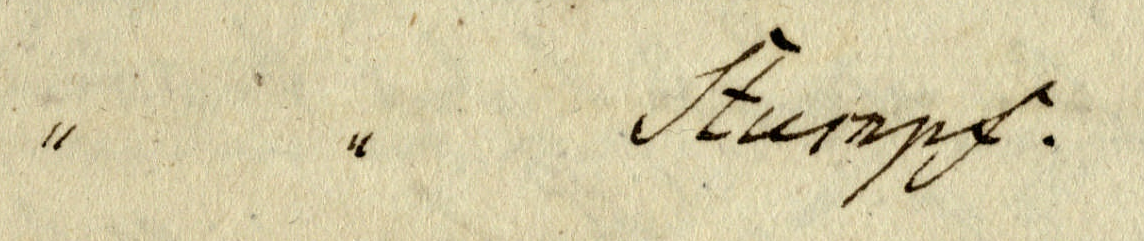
Stumpf.
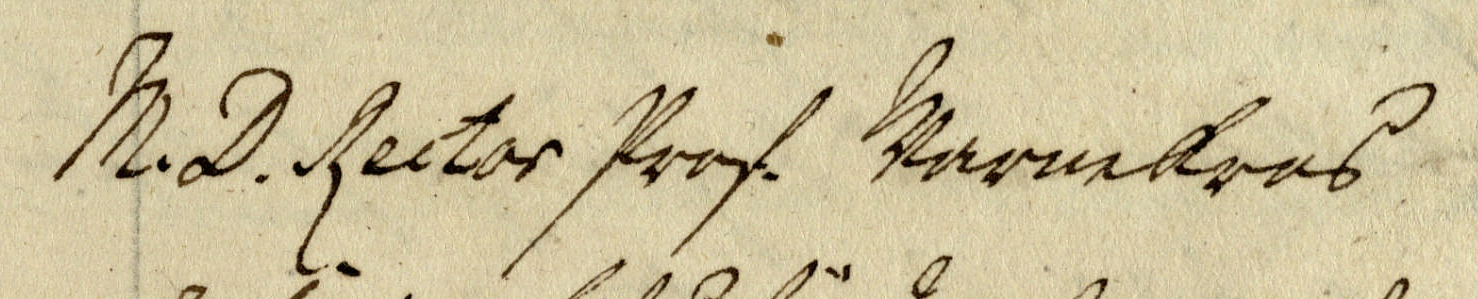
M. D. Rector Prof. Warnekros
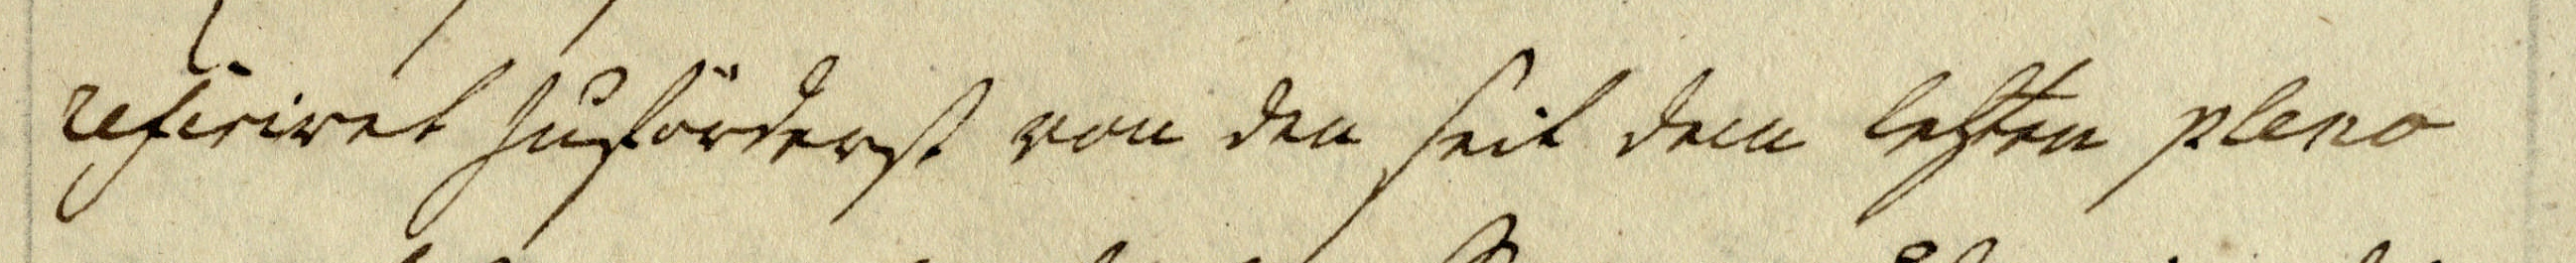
referiret zuförderst von den seit dem letzten pleno
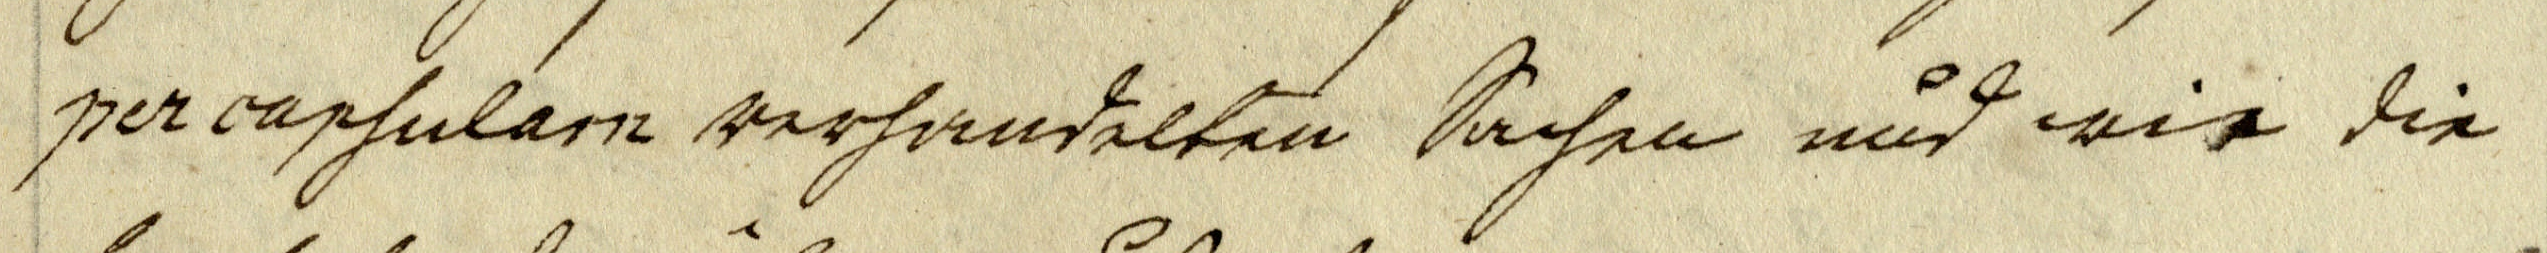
per capsulam verhandelten Sachen und wie die
